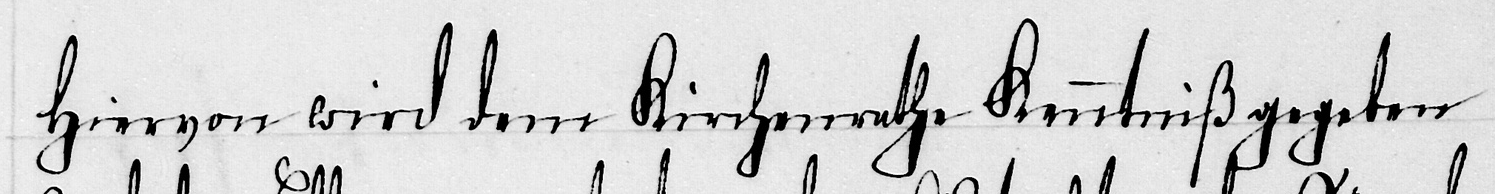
Hiervon wird dem Kirchenrathe Kenntniß gegeben
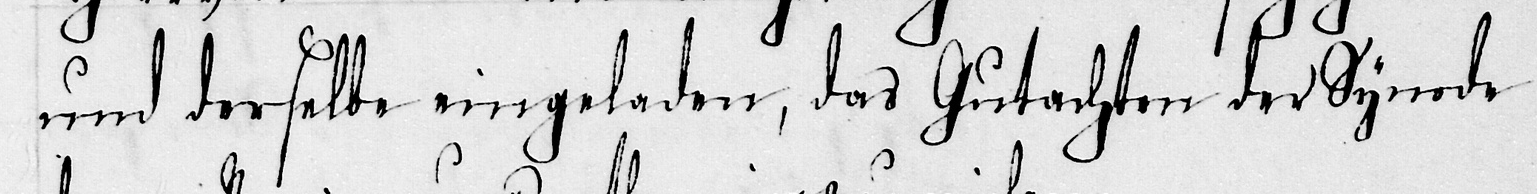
und derselbe eingeladen, das Gutachten der Synode
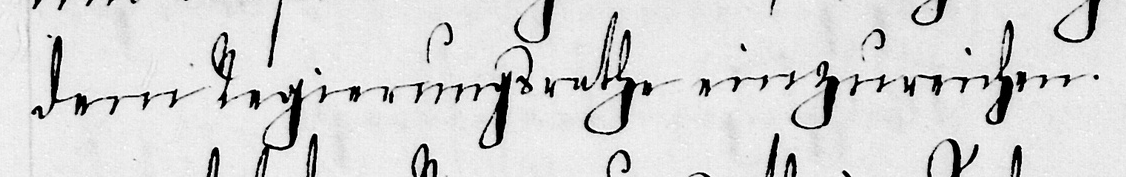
dem Regierungsrathe einzureichen.
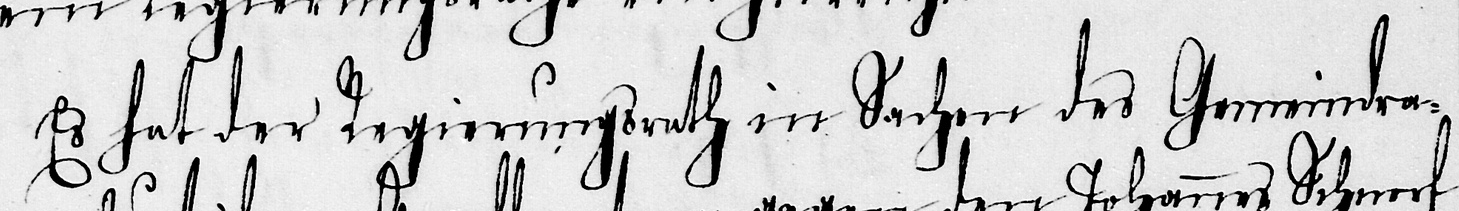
Es hat der Regierungsrath in Sachen des Gemeindra¬
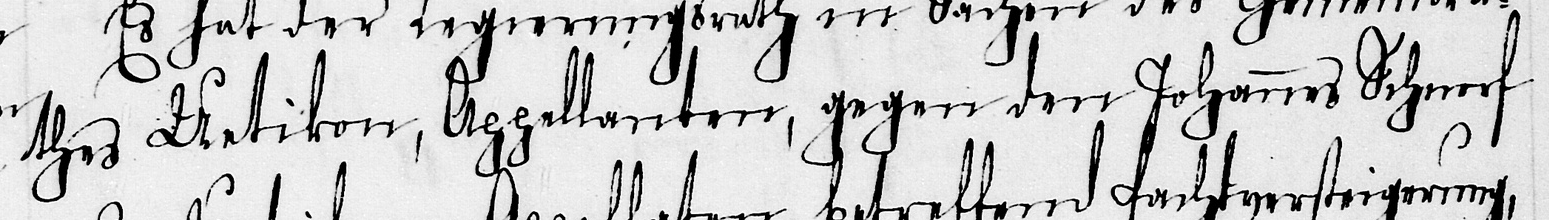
thes Uetikon, Appellanten, gegen den Johannes Schnorf
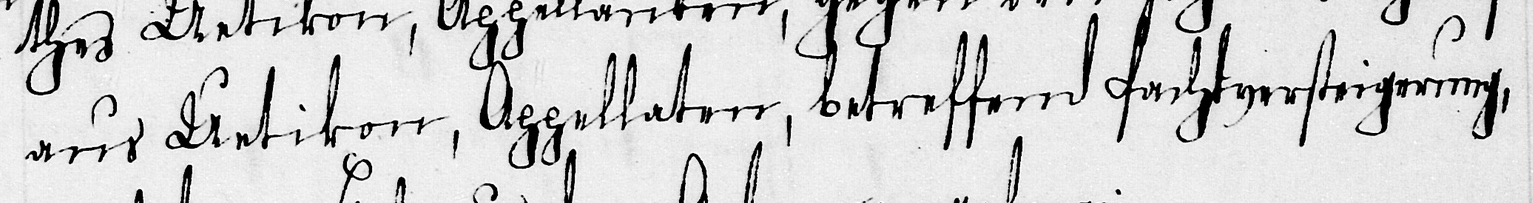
aus Uetikon, Appellaten, betreffend Pachtversteigerung,
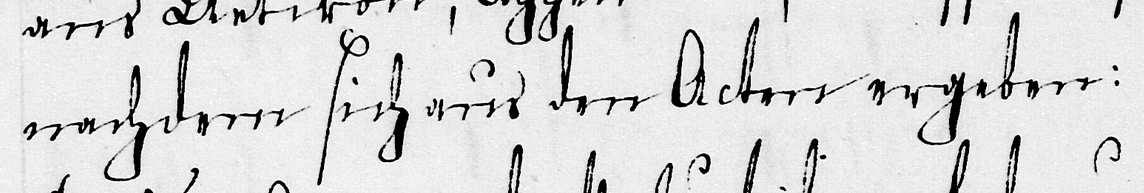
nachdem sich aus den Acten ergeben:
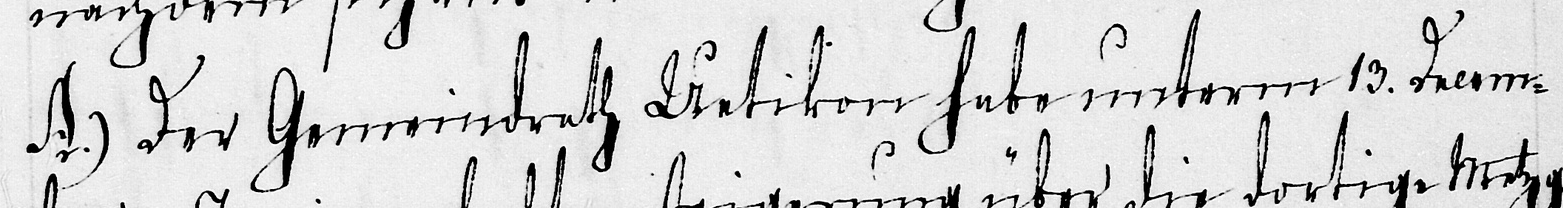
A.) Der Gemeindrath Uetikon habe unterm 13. Decem¬
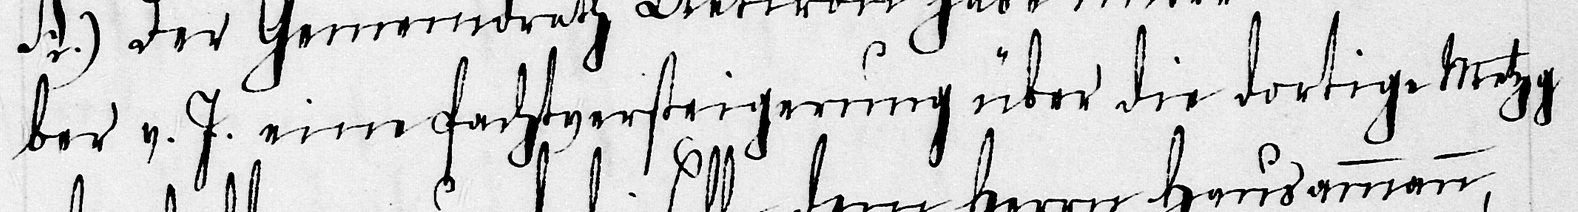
ber v. J. eine Pachtversteigerung über die dortige Metzg
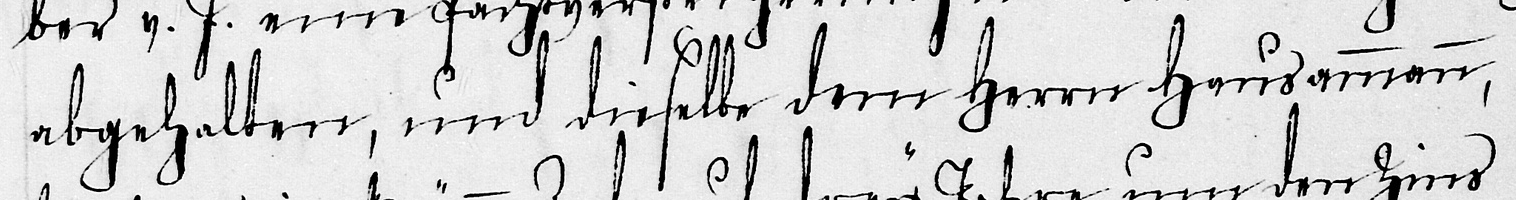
abgehalten, und dieselbe dem Herrn Hausammann,
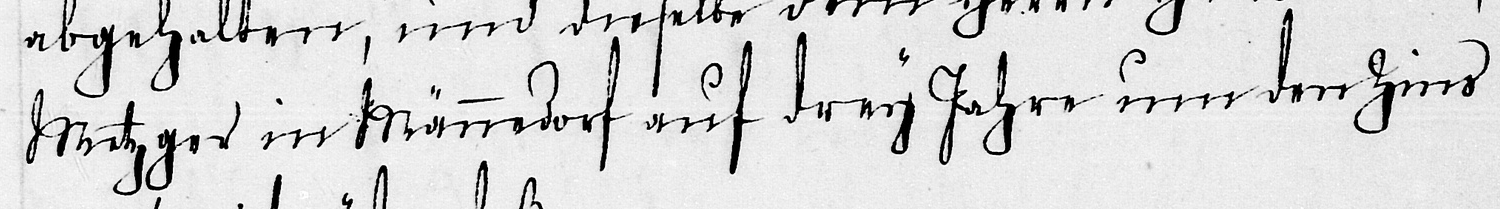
Metzger in Männedorf auf drey Jahre um den Zins
